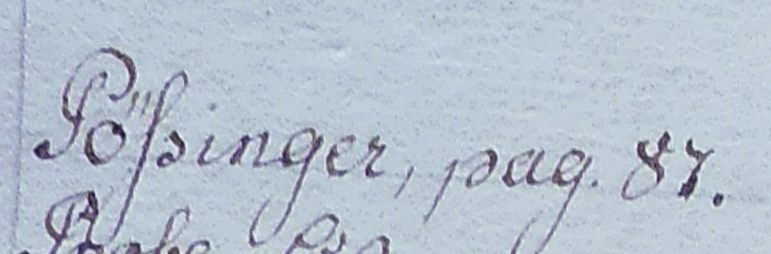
Pössinger, pag 87.
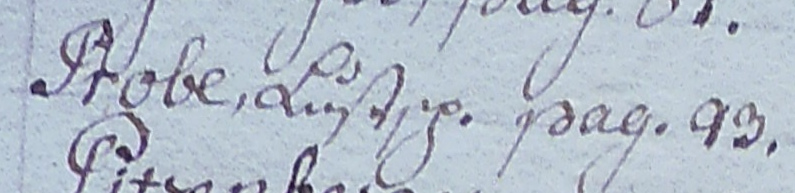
Probe, Lustsp. pag. 93.
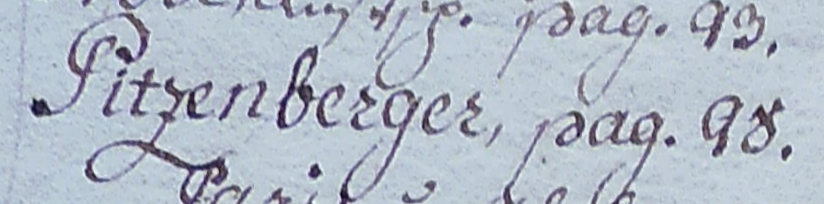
Pitzenberger, pag. 98.
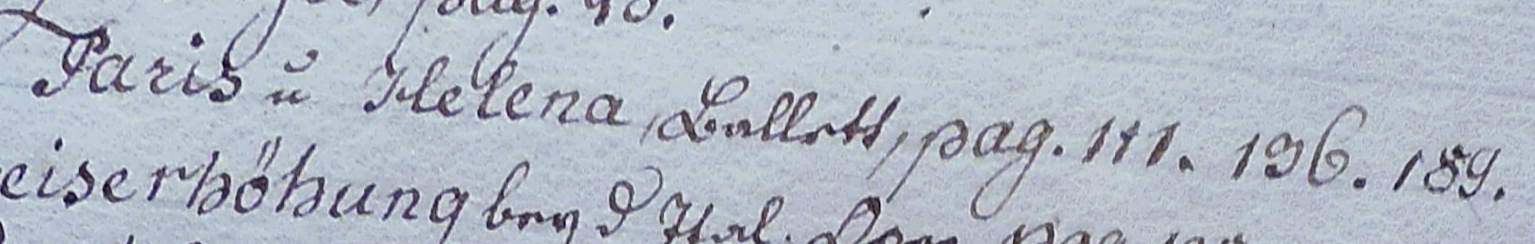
Paris u Helena, Ballett, pag. 111. 136. 189.
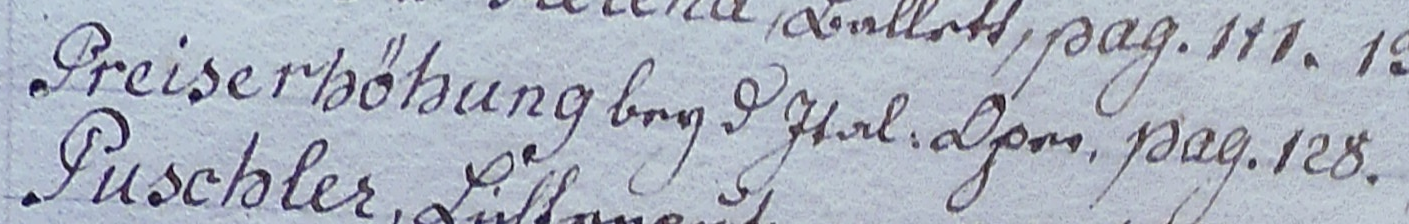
Preiserhöhung bey d Ital: Oper, pag. 128.
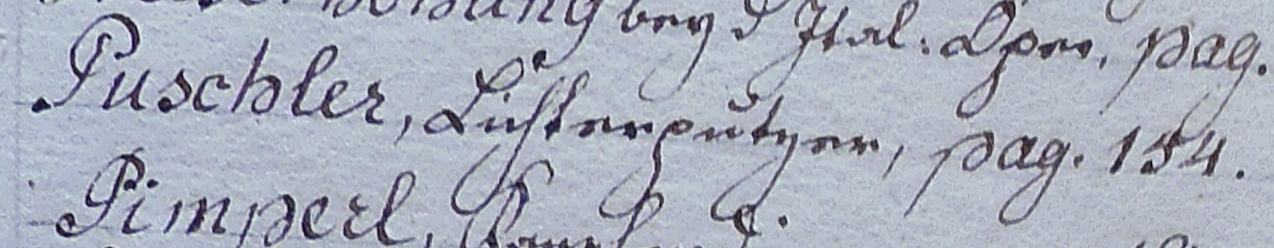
Puschler, Lichterputzer, pag. 154.
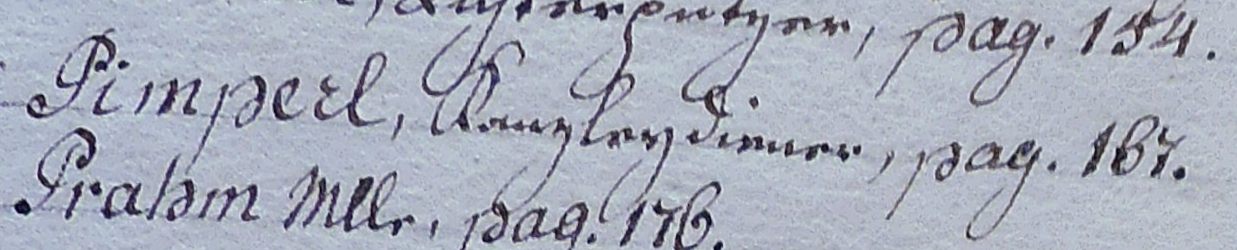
Pimperl, Kanzleydiener, pag. 167.
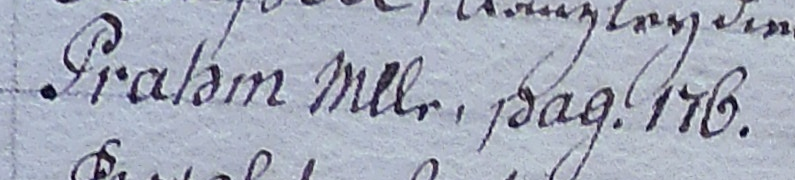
Prahm Mlle, pag. 176.
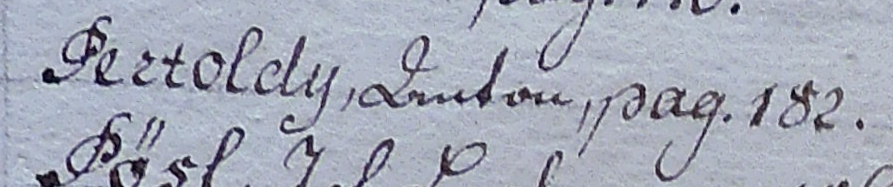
Pertoldy, Anton, pag. 182.
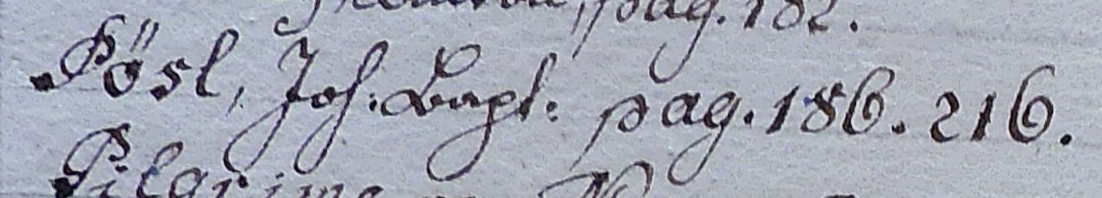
Pösl, Joh: Bapt: pag. 186. 216.
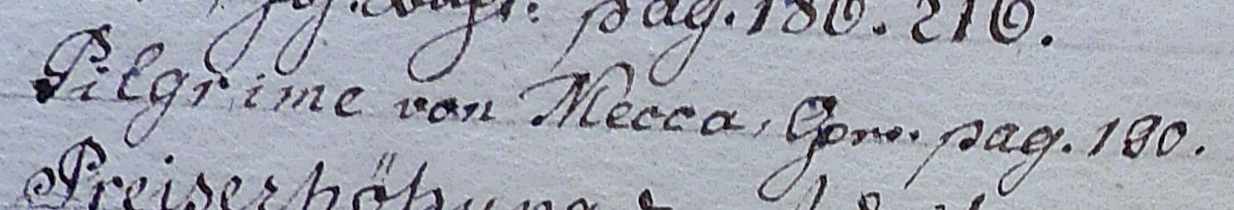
Pilgrime von Mecca, Oper. pag. 190.
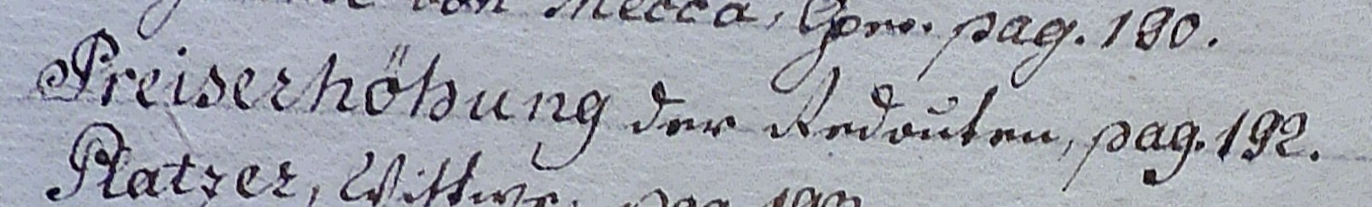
Preiserhöhung der Redouten, pag. 192.
